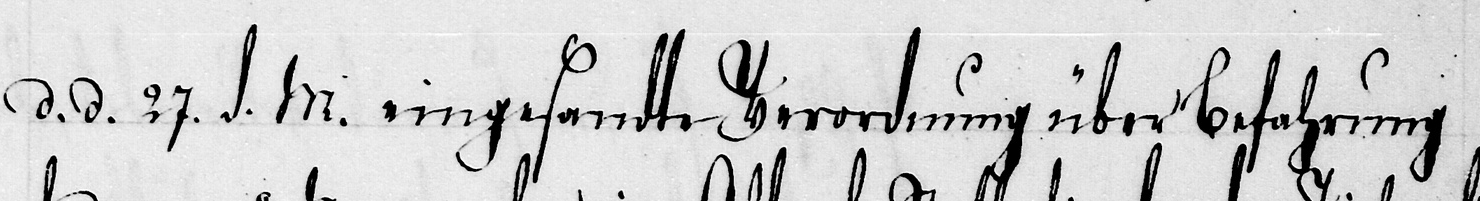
d. d. 27. d. M. eingesandte Verordnung über Befahrung
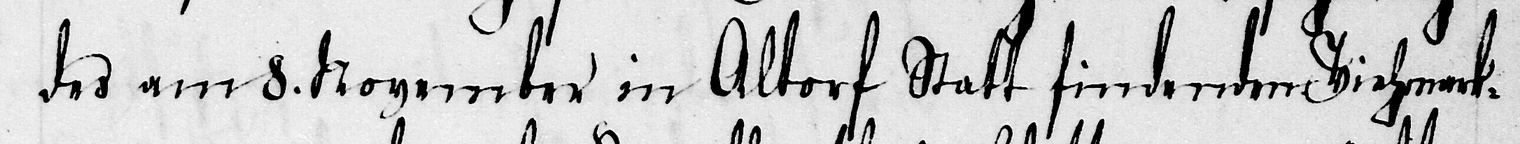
des am 8. November in Altorf Statt findenden Viehmark¬
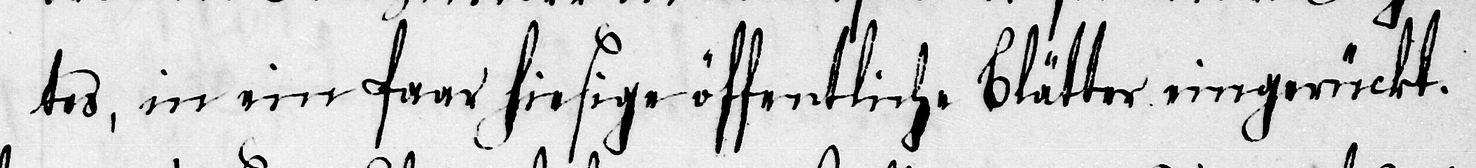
tes, in ein Paar hiesige öffentliche Blätter eingerückt.
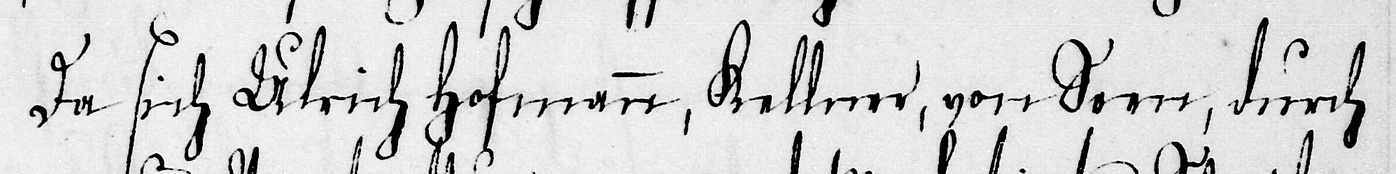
Da sich Ulrich Hofmann, Kellner, von Seen, durch
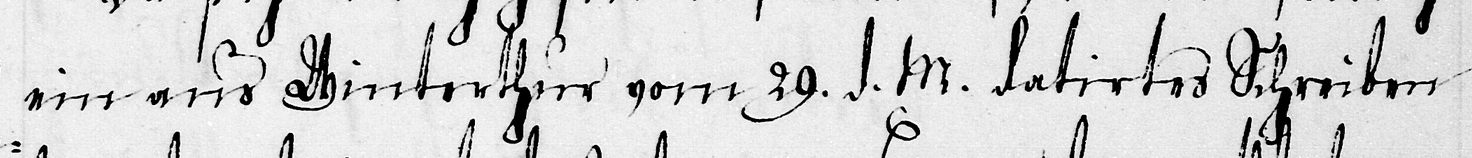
ein aus Winterthur vom 29. d. M. datirtes Schreiben
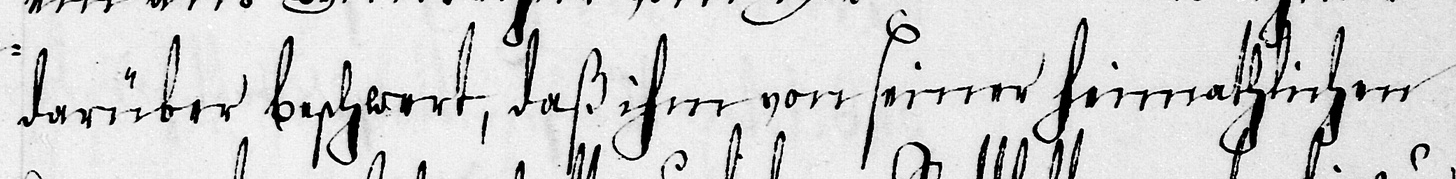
darüber beschwert, daß ihm von seiner heimathlichen
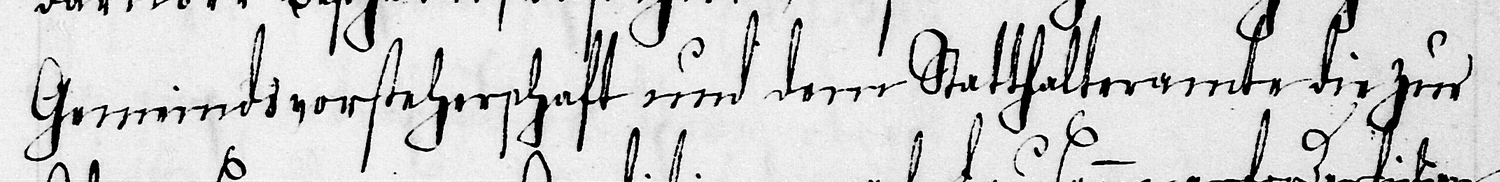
Gemeindsvorsteherschaft und dem Statthalteramte die zur
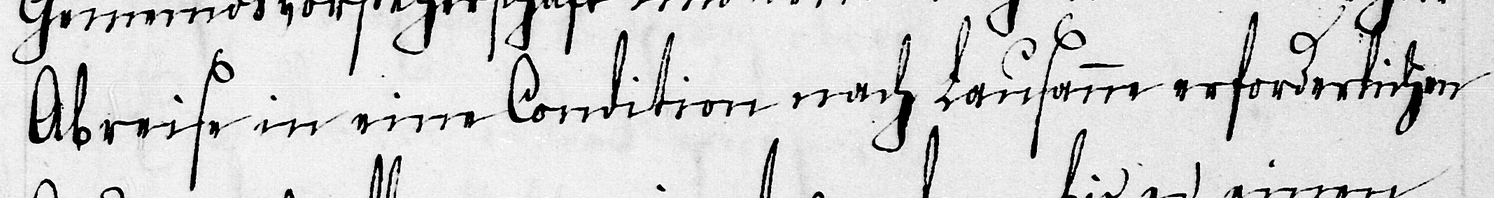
Abreise in eine Condition nach Lausanne erforderlichen
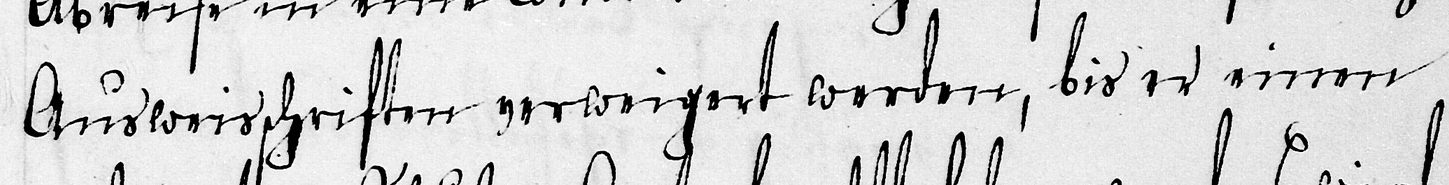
Ausweisschriften verweigert werden, bis er einen
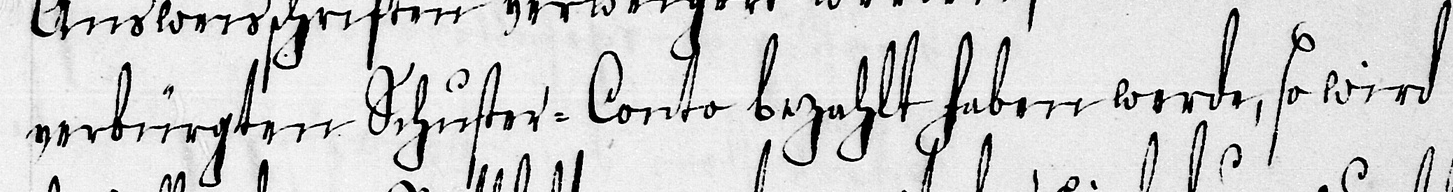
verbürgerten Schuster-Conto bezahlt haben werde, so wird
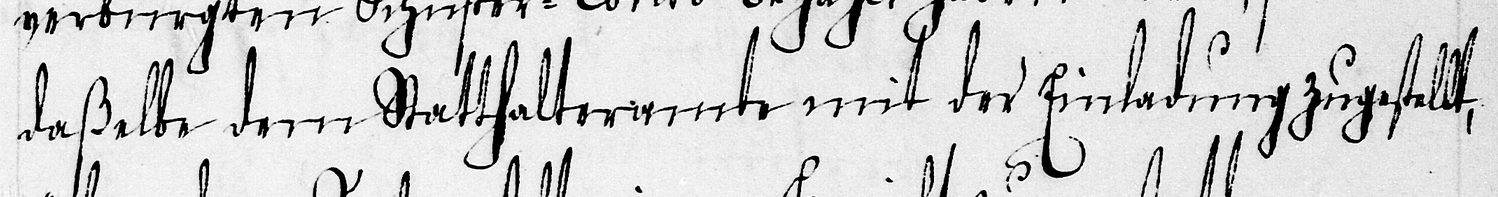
daßelbe dem Statthalteramte mit der Einladung zugestel¬
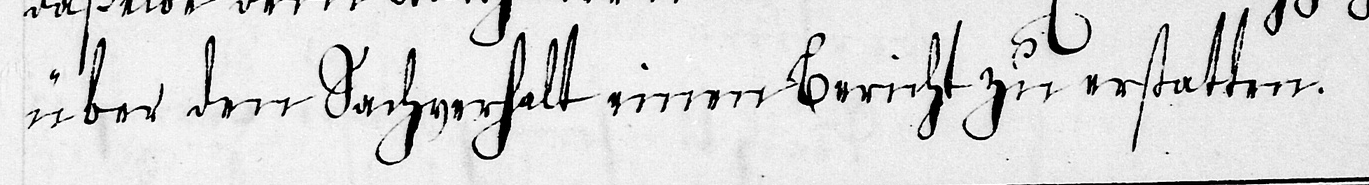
über den Sachverhalt einen Bericht zu erstatten.
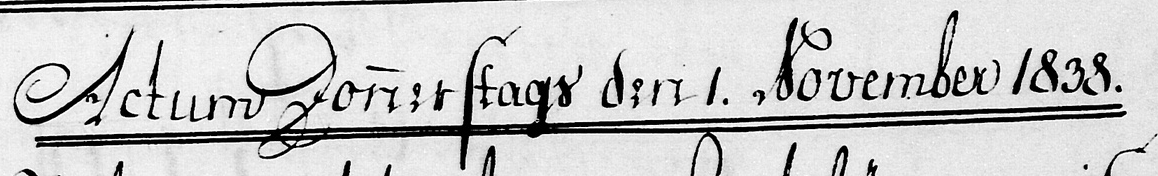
Actum Dienstags den 30. October 1838.]
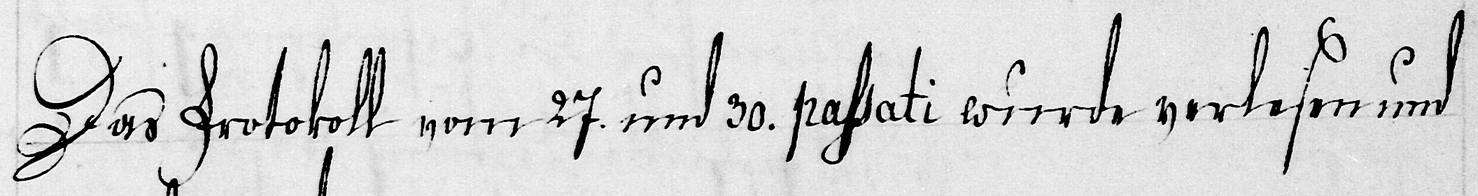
Das Protokoll vom 27. und 30. passati wurde verlesen und
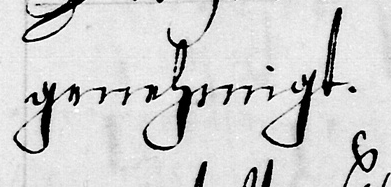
genehmigt.
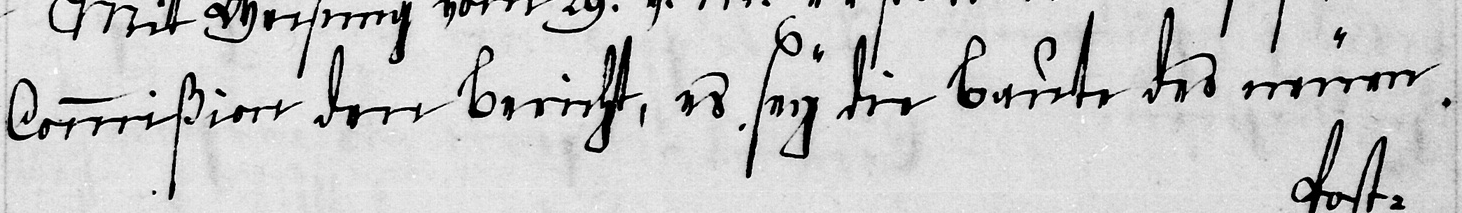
ommißion den Bericht, es sey die Baute des neuen
